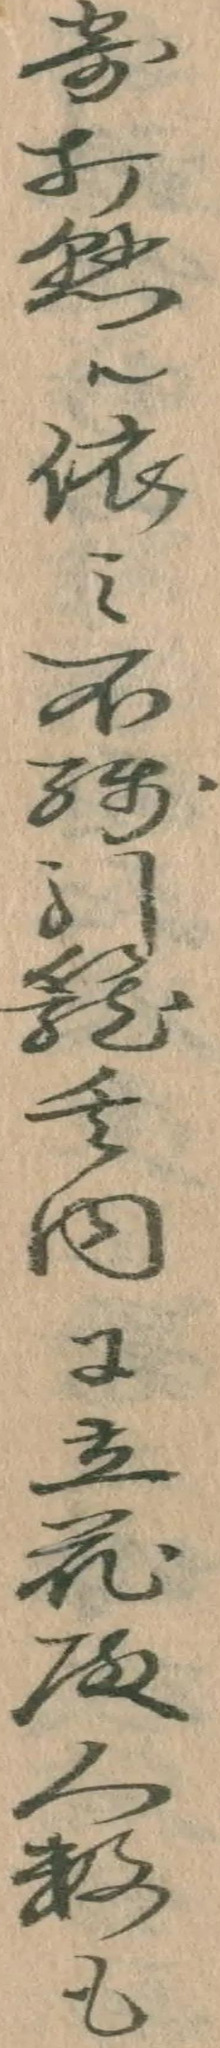寄打懸る依之不残引籠其内尓立花殿人数も
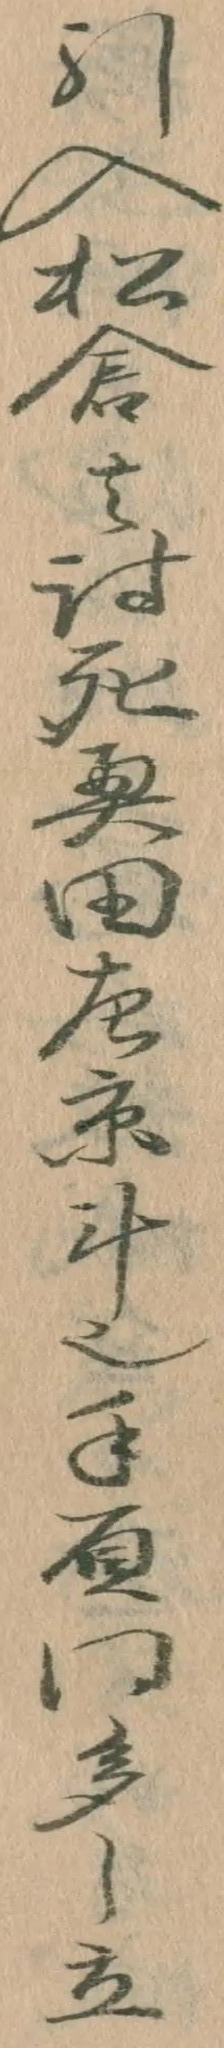引入松倉者討死奥田左京斗也手負同多し立
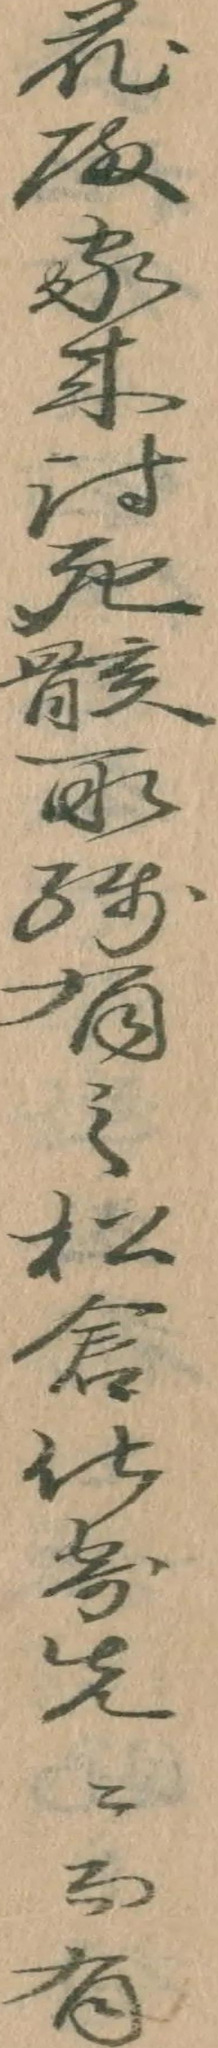花殿家来討死骸取残有之松倉仕寄先に而有
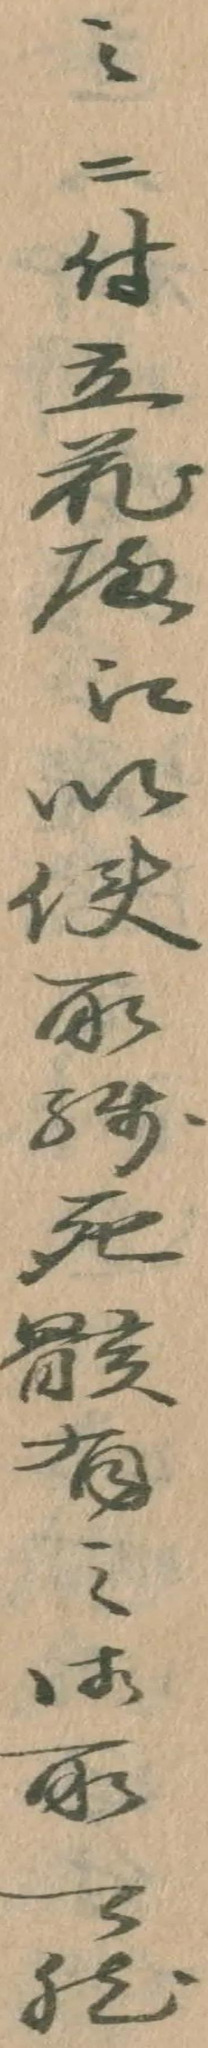之に付立花殿江以使取残死骸有之御取可然
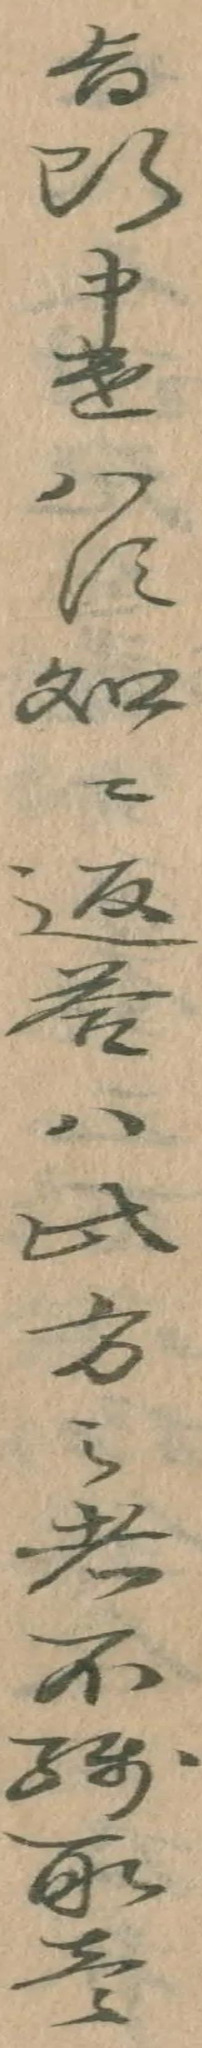旨断申遣は須処に返答は此方之者不残取壱
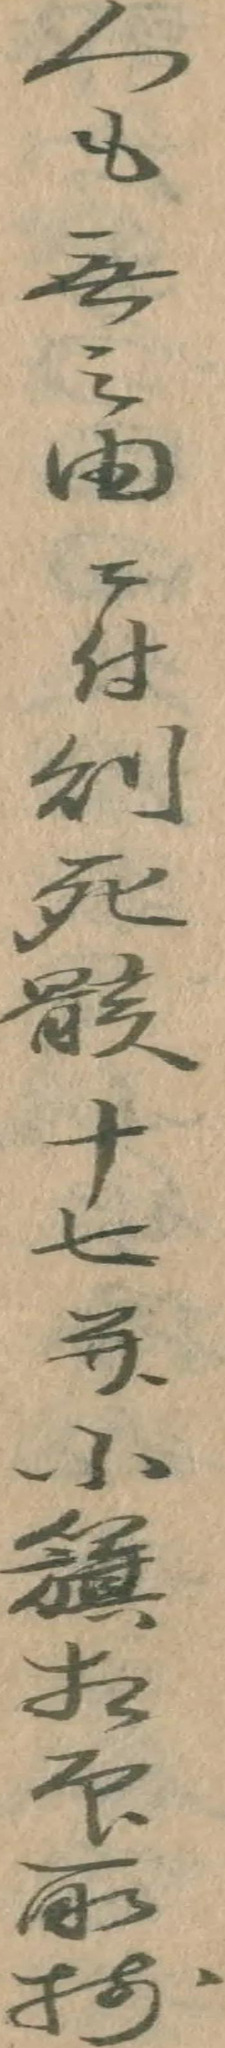人も無之由に付則死骸十七幷小籏相印取残
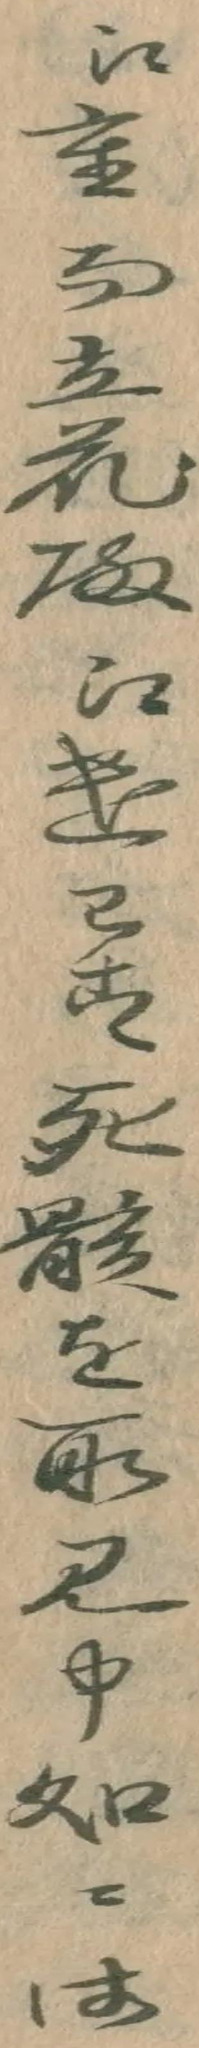江重而立花殿江遣已春死骸を取見申処に御
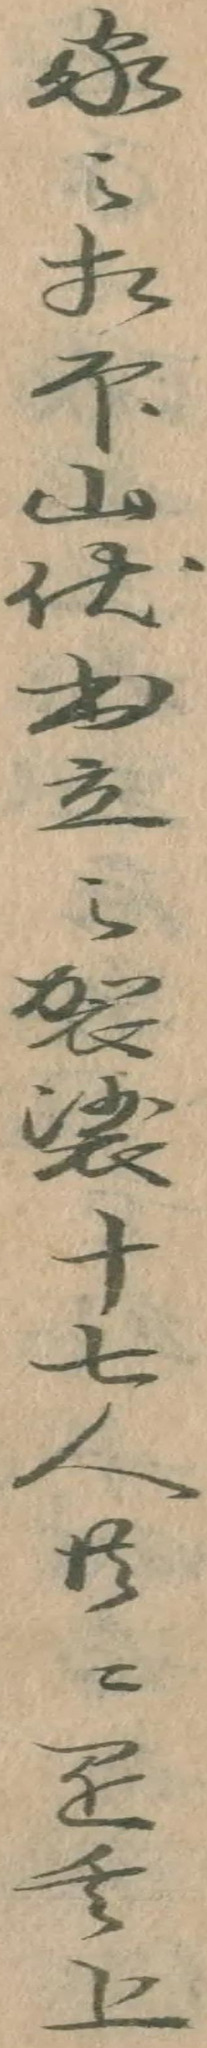家之相印山伏出立之袈裟十七人共に懸其上
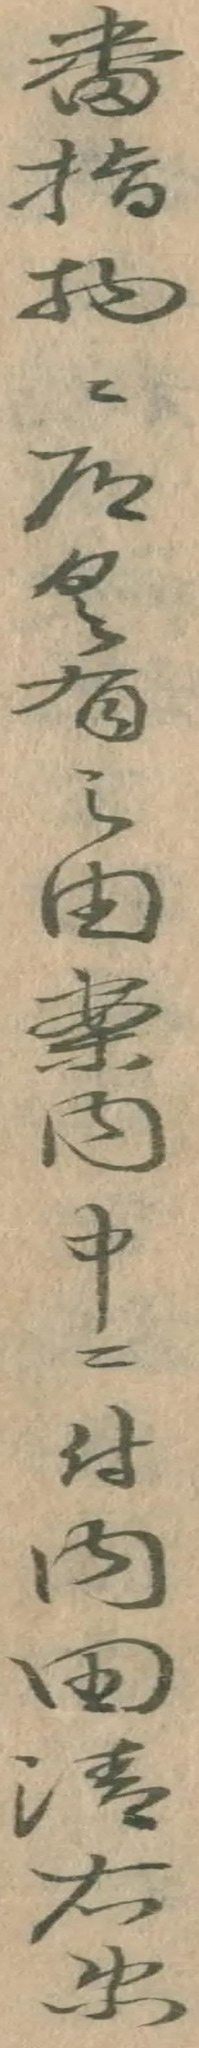番指物に道具有之由案内申に付内田清右衛
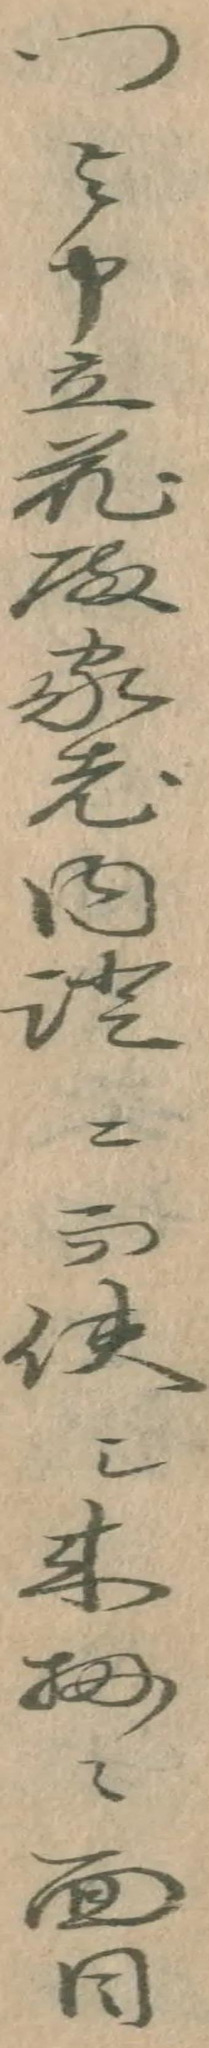門与申立花殿家老内證に而使し来扨々面目
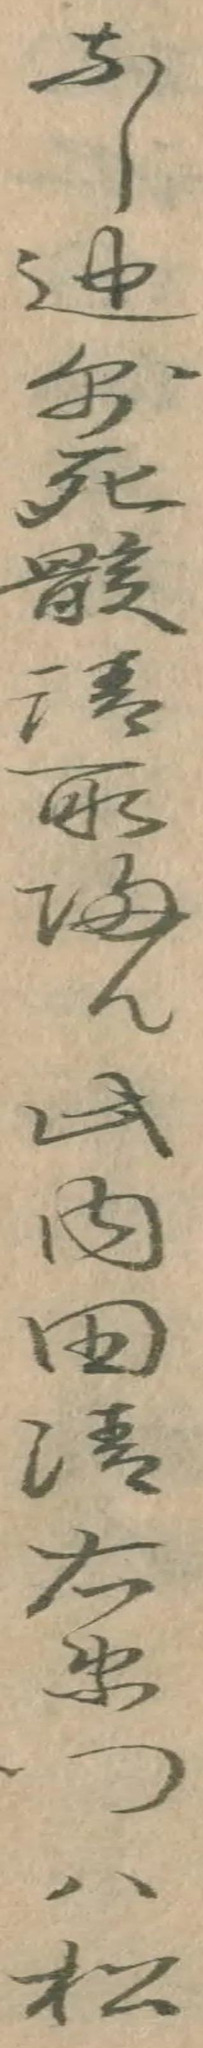なし迚前死骸請取帰ん此内田清右衛門は松
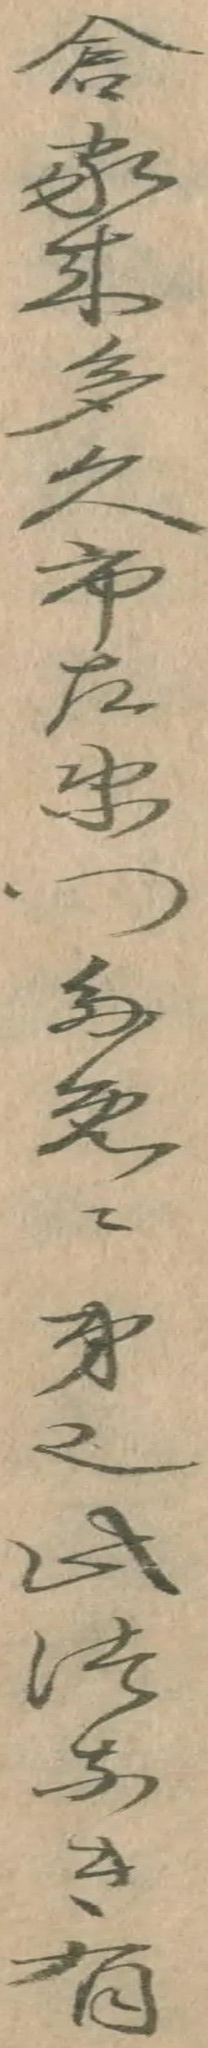倉家来多久市左衛門多免に弟也此徒なき有

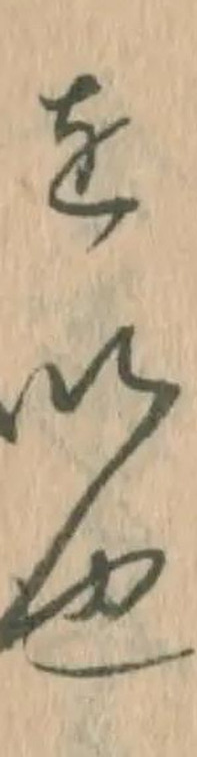を以也
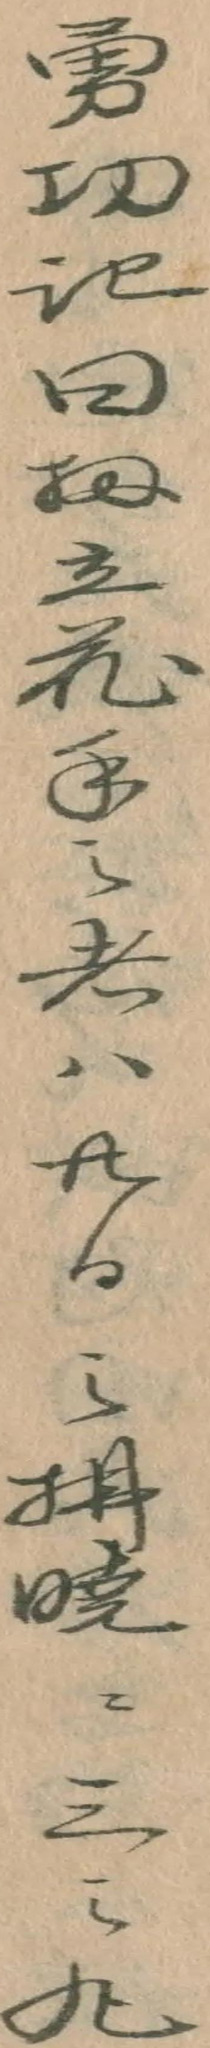勇功記曰扨立花手之者は廿日之払暁に三之丸
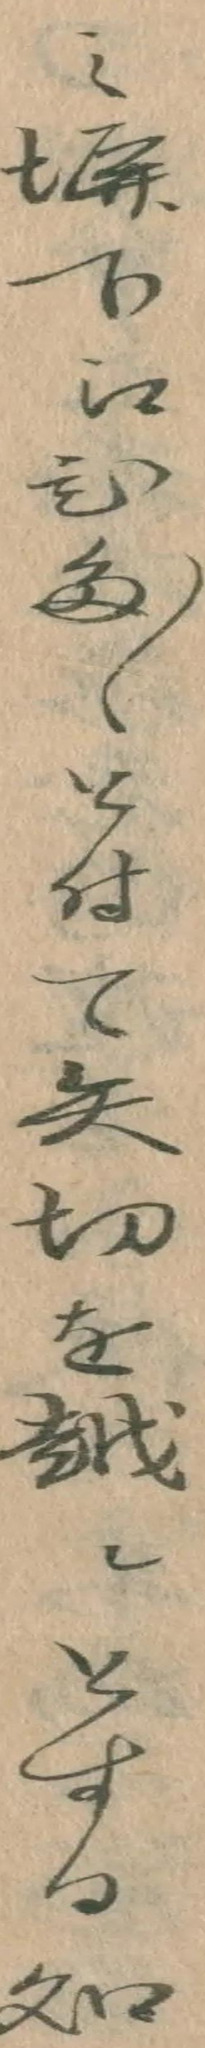之塀下江置多々と付て矢切を越しとする処
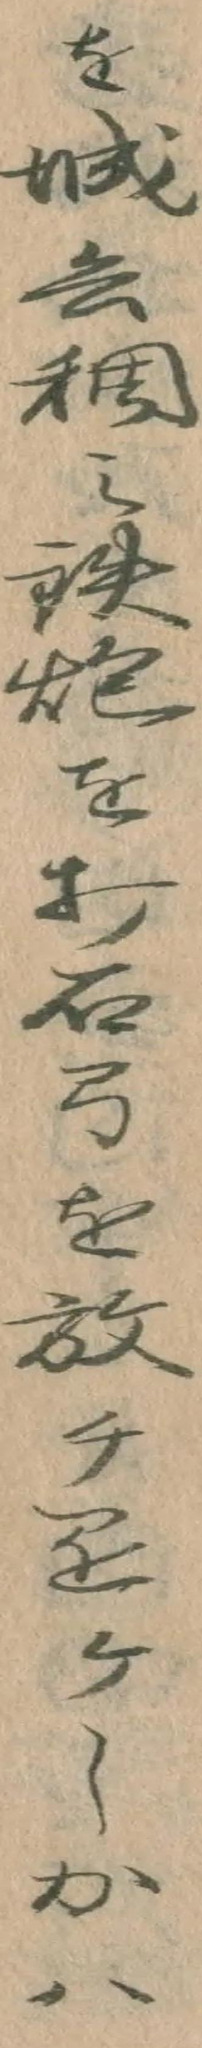を城兵稠之鉄炮を打石弓を放ち懸けしかは
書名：切支丹御退治記 49巻. [4]
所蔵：国立国会図書館 National Diet Library, JAPAN
